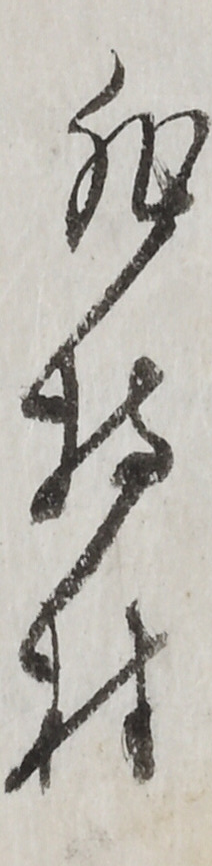非持村
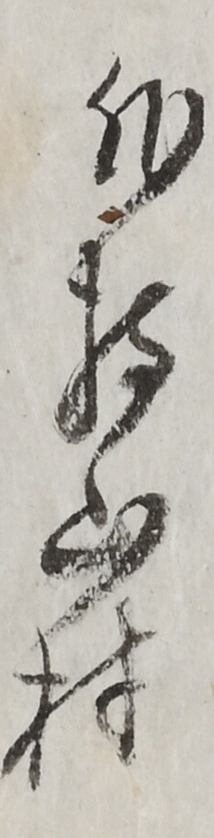非持山村

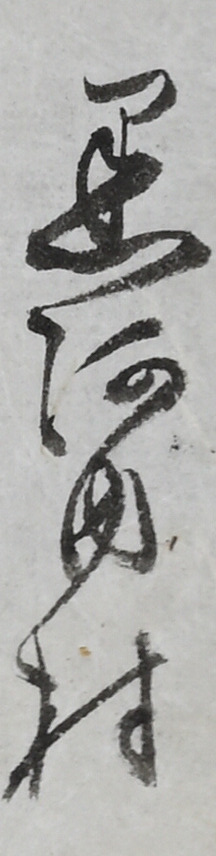黒河内村
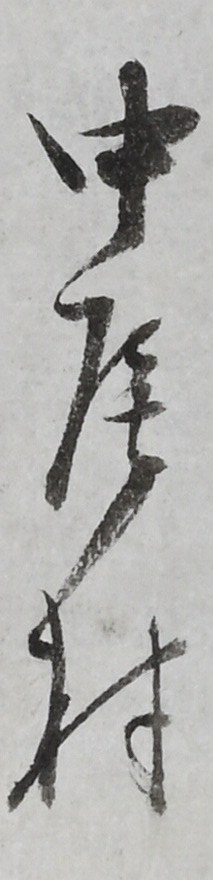中尾村
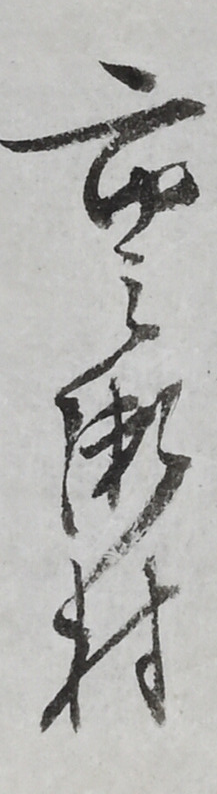市之瀬村
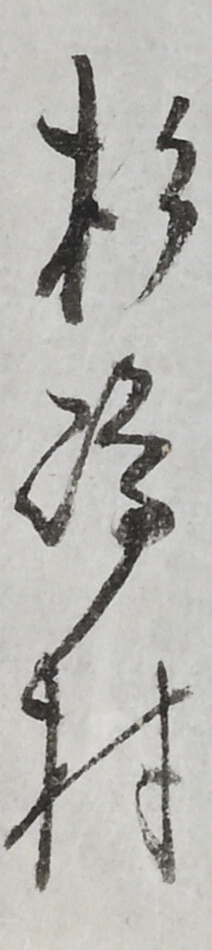杉嶋村
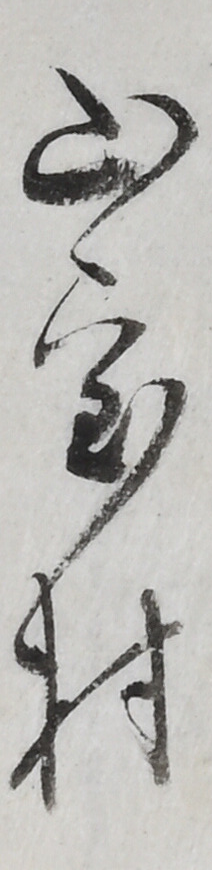山室村
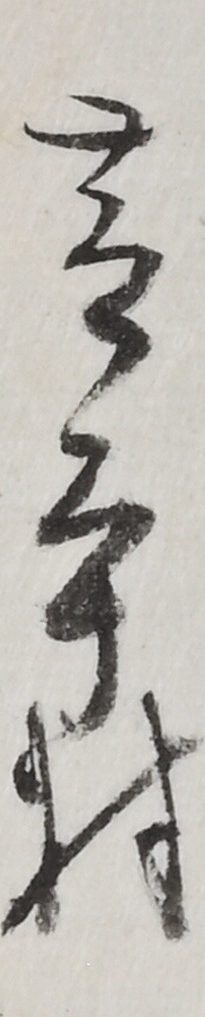芝平村
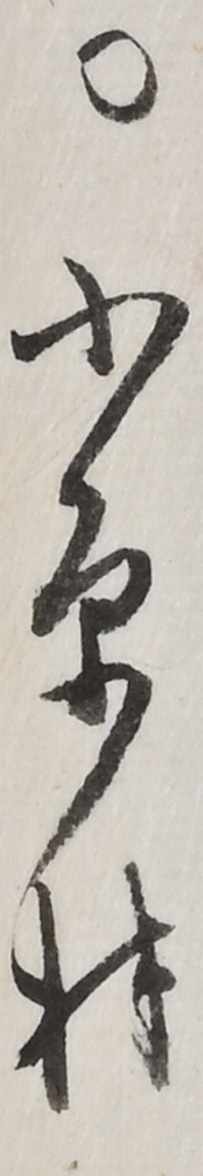〇小原村
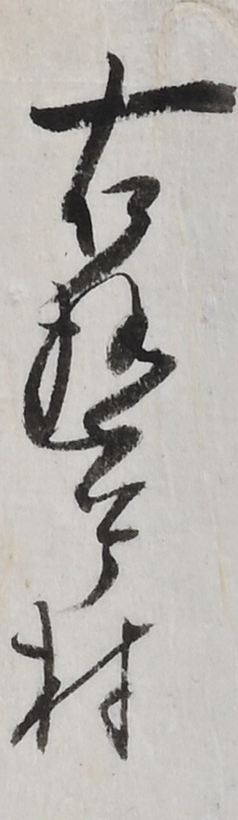右拾六ヶ村
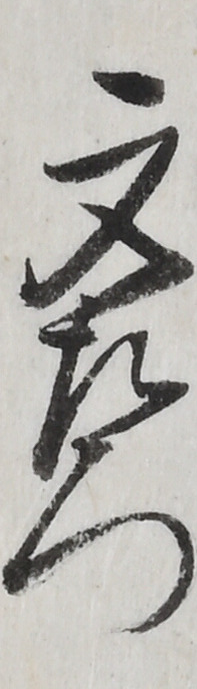文左衛門
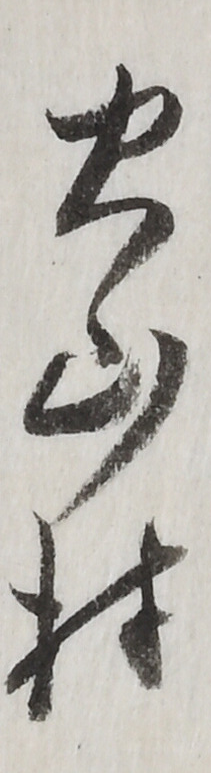火山村
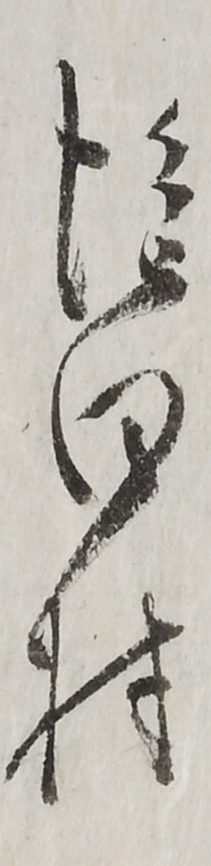塩田村
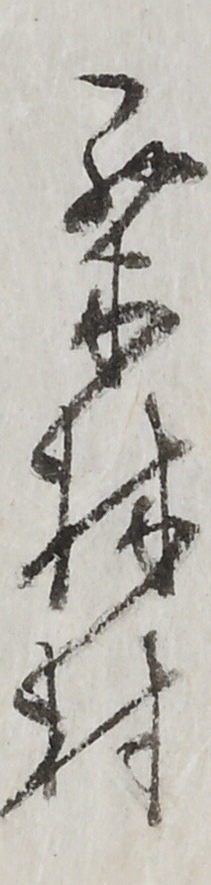栗林村
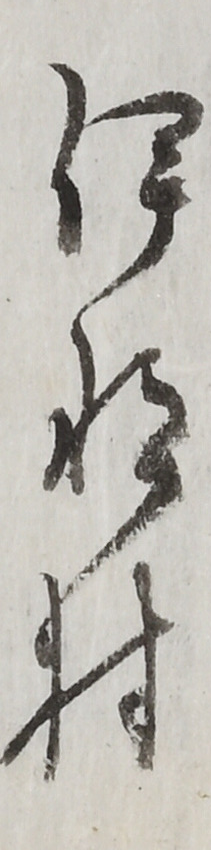伊那村
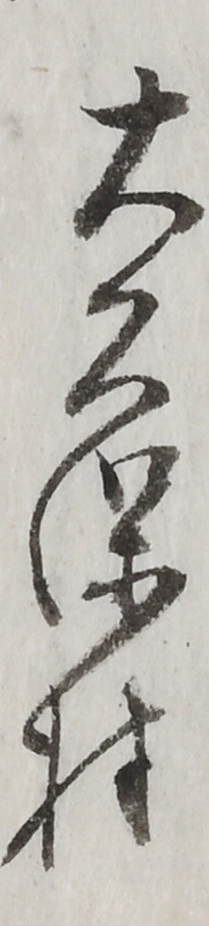大久保村
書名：年内行事帳
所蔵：伊那市立高遠町図書館・合同会社AMANE
